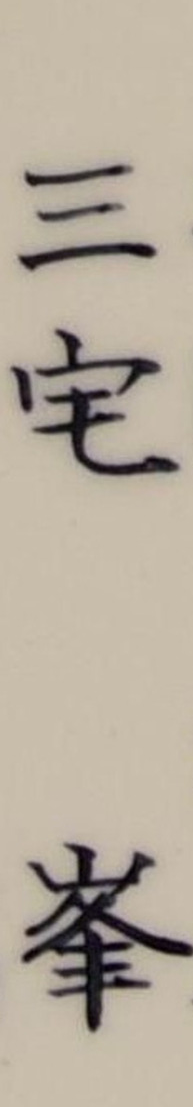三宅峯
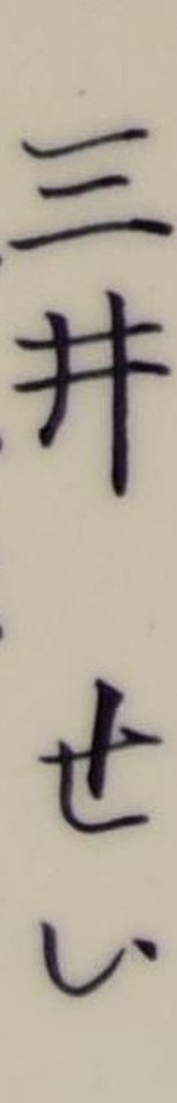三井せい
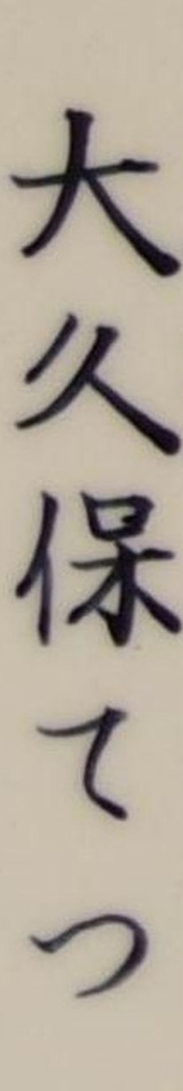大久保てつ
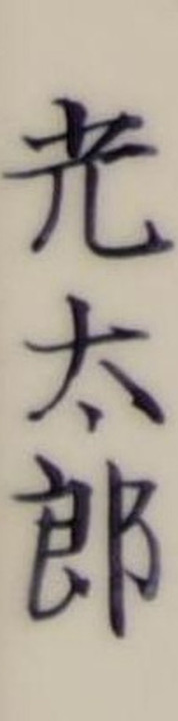光太郎

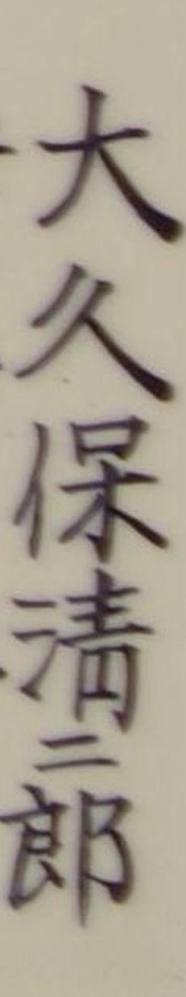大久保清二郎
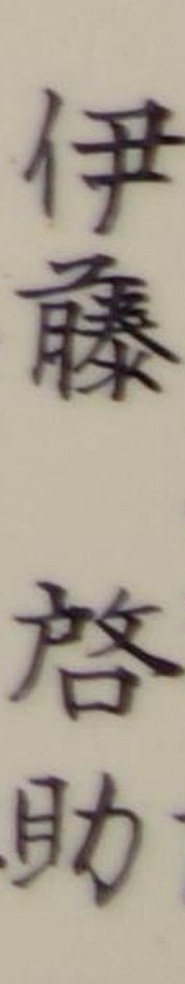伊藤啓助
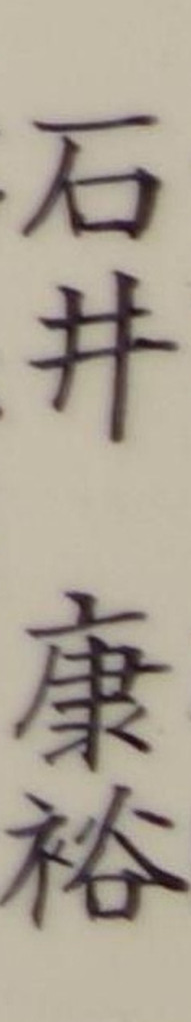石井康格
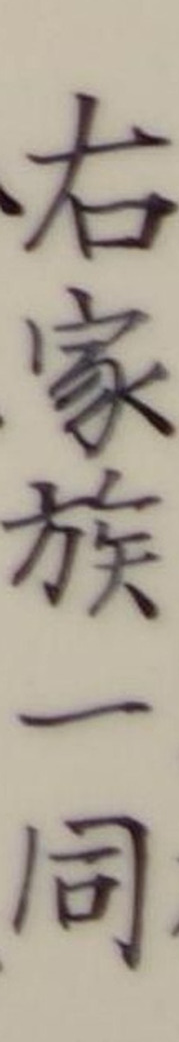右家族一同
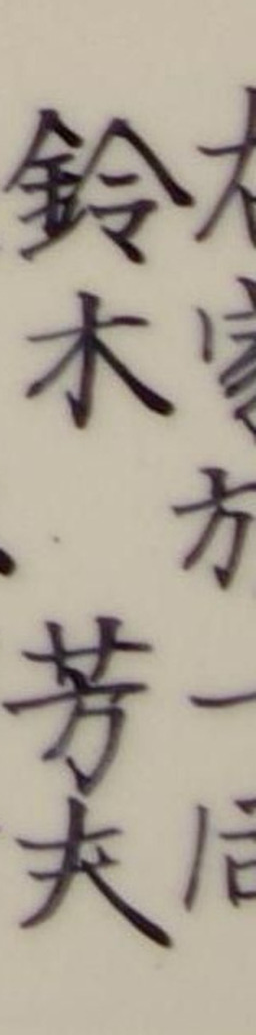鈴木芳夫
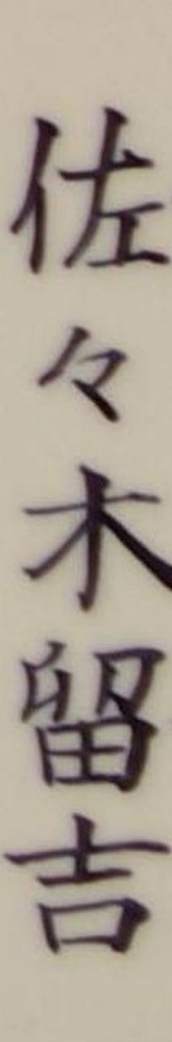佐々木留吉
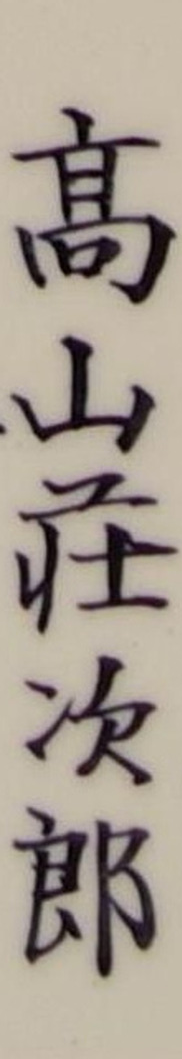高山荘次郎
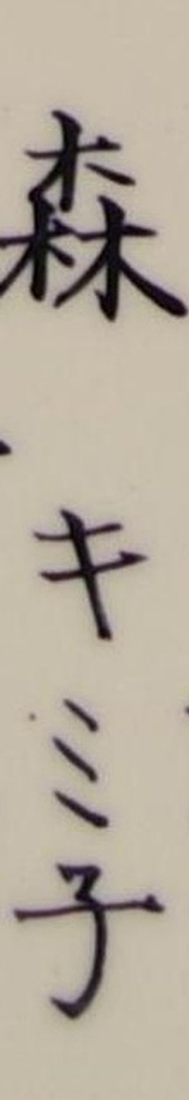森キミ子
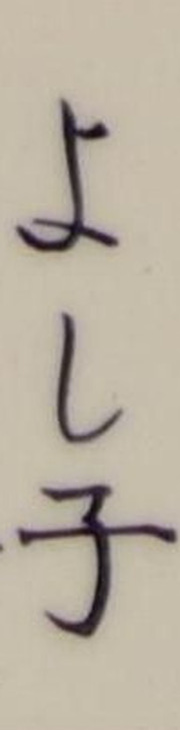よし子
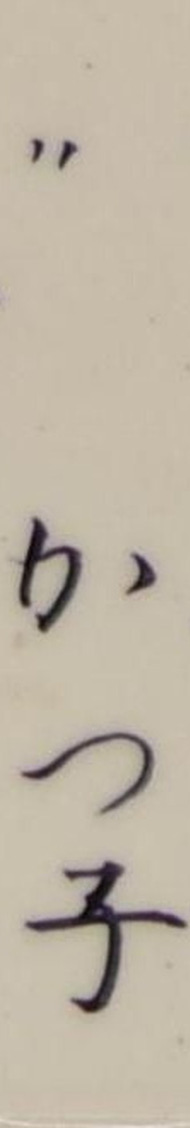かつ子
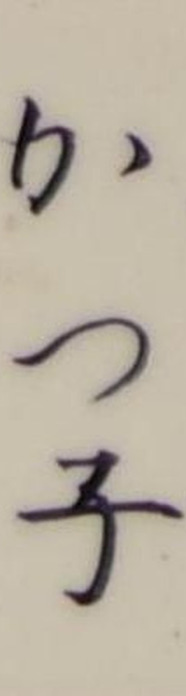かつ子
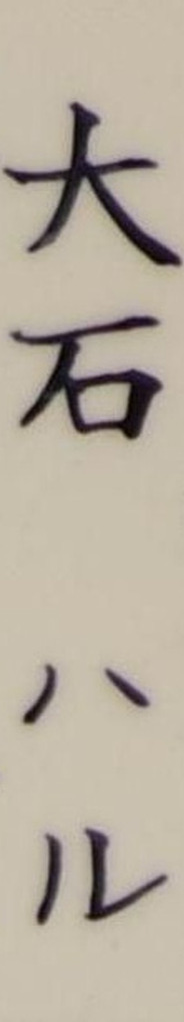大石ハル
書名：E~L
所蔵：高野山金剛峯寺
